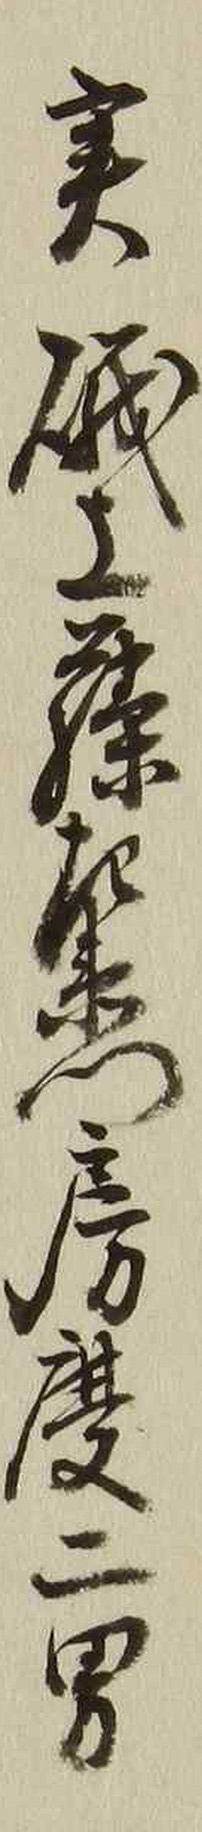実磯上藤左衛門房慶二男
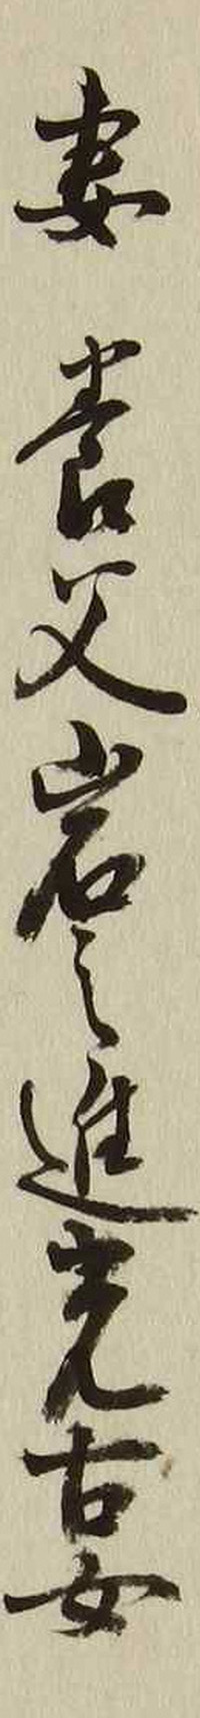妻養父岩之進光古女
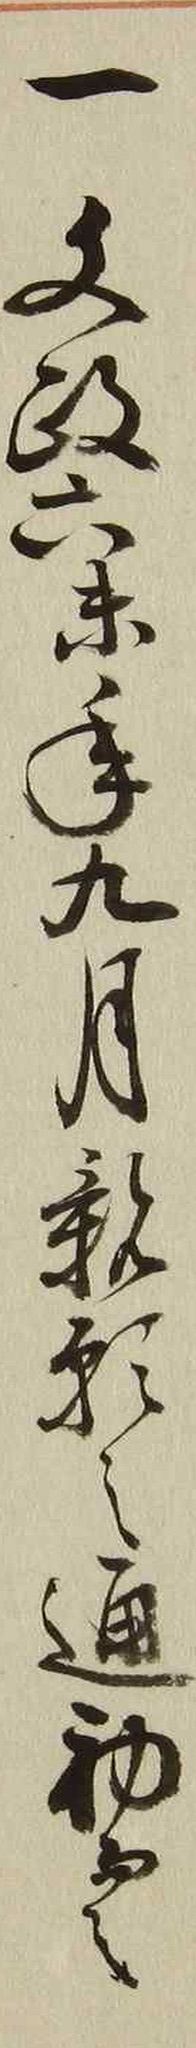一文政六未年九月親願之通初而之
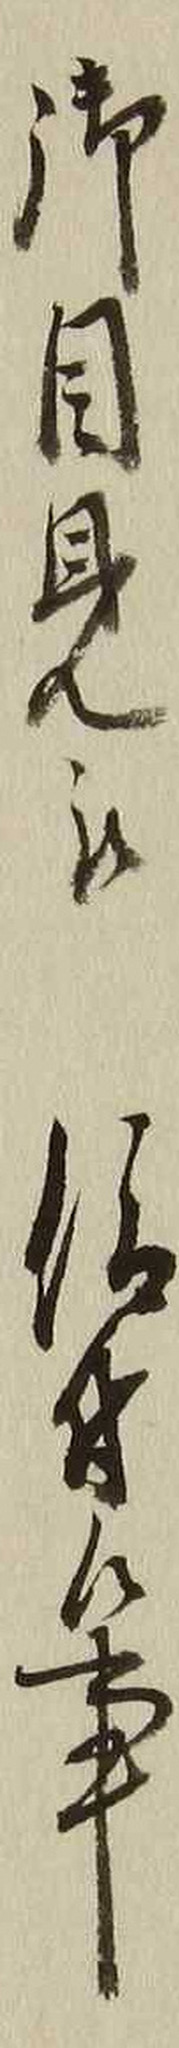御目見被仰付候事
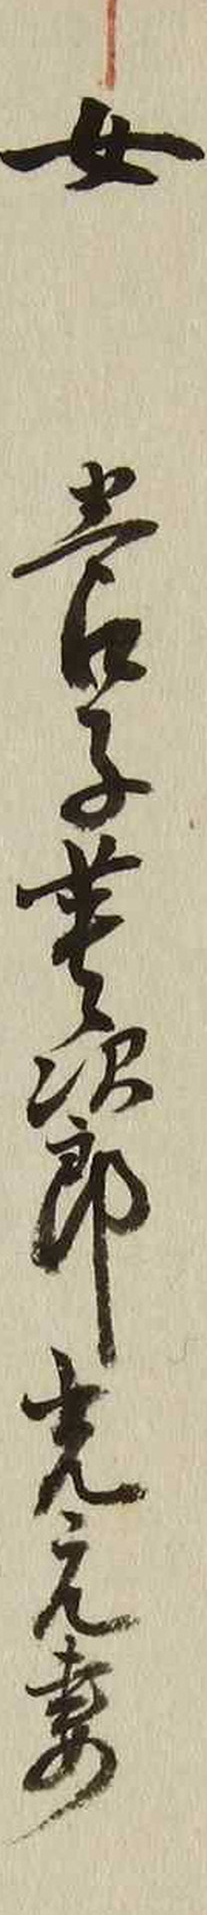女養子英次郎光元妻
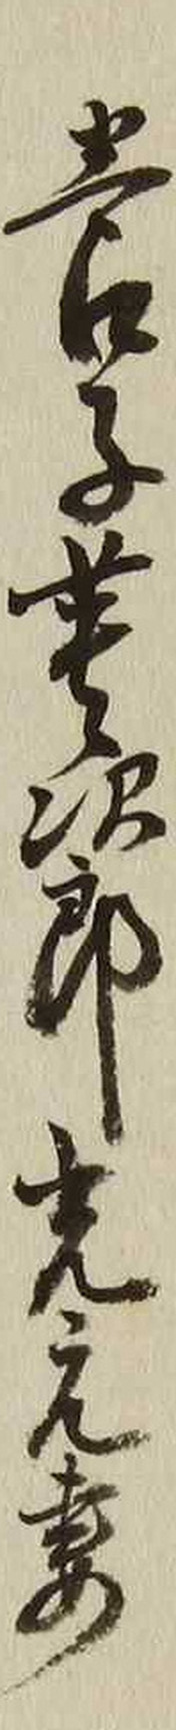女養子英次郎光元妻
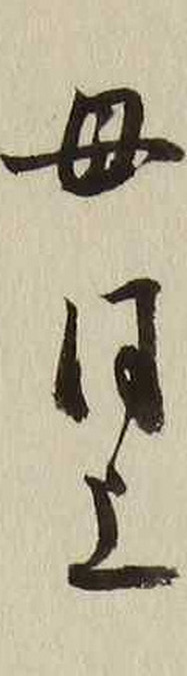母同上
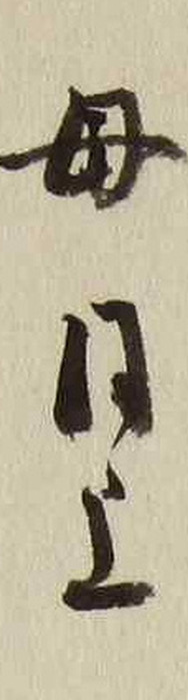母同上
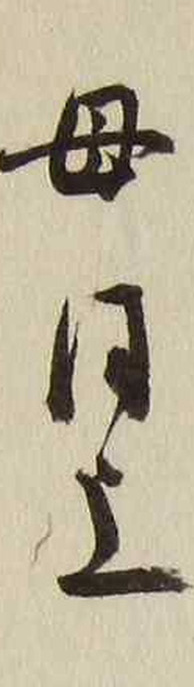母同上
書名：諸士系譜　巻之27　い之部27
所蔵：会津若松市立会津図書館
